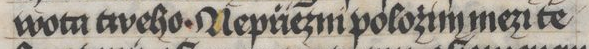wota tweho.Nepṙíezni polożim mezí te¬
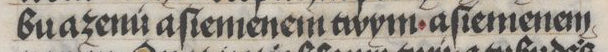bu a zemi a ſiemenem twym.a ſiemenem
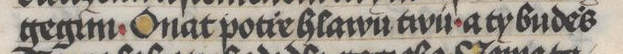gegim.Onat potṙe hlawu twú.a ty budeṡ
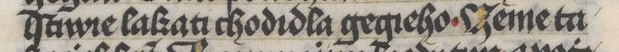lſtiwie lakati chodidla gegieho.Zenie ta¬
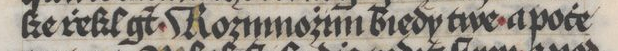ke ṙekl ḡt.Rozmnożim biedy twe.a poċe¬
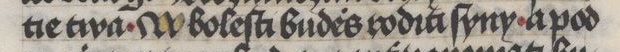tie twa.W boleſti budeṡ roditi ſyny.a pod
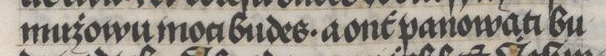mużowu moci budes.a onṫ panowati bu¬
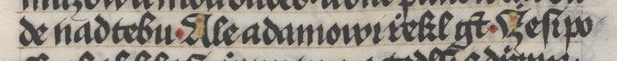de nadtebu.Ale adamowi ṙekl ḡt.Żeſi po¬
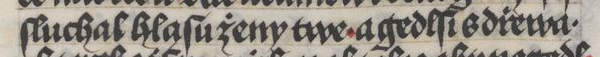ſluchal hlaſú żeny twe.a gedlſi s dřewa.
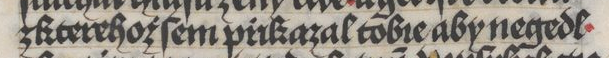z kterehoż ſem pṙikazal tobie aby negedl.
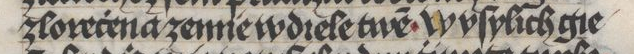zloreċena zemie wdiele twē.W vſylich gie¬
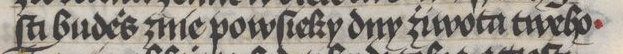ſti budeṡ zníe powẛíeky dny żíwota tweho.
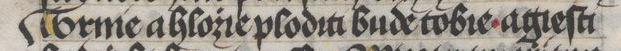Trníe a hlożie ploditi bude tobie.a gieſti
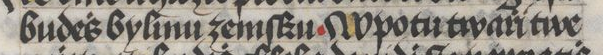budeṡ bylinu zemſku.Wpotu twaṙí twe
